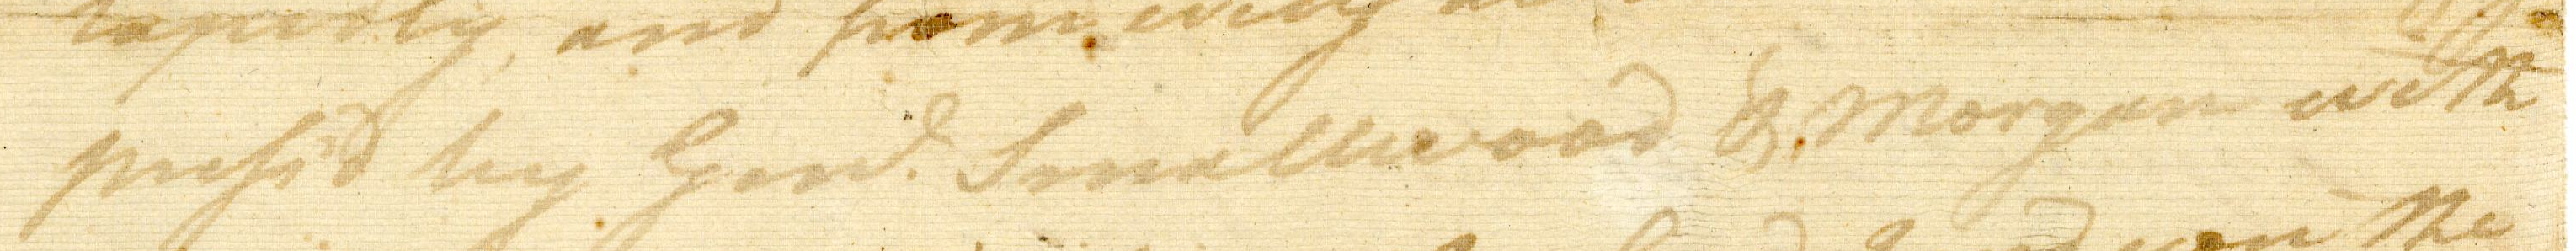press'd by Gen^l Smallwood & Morgan with
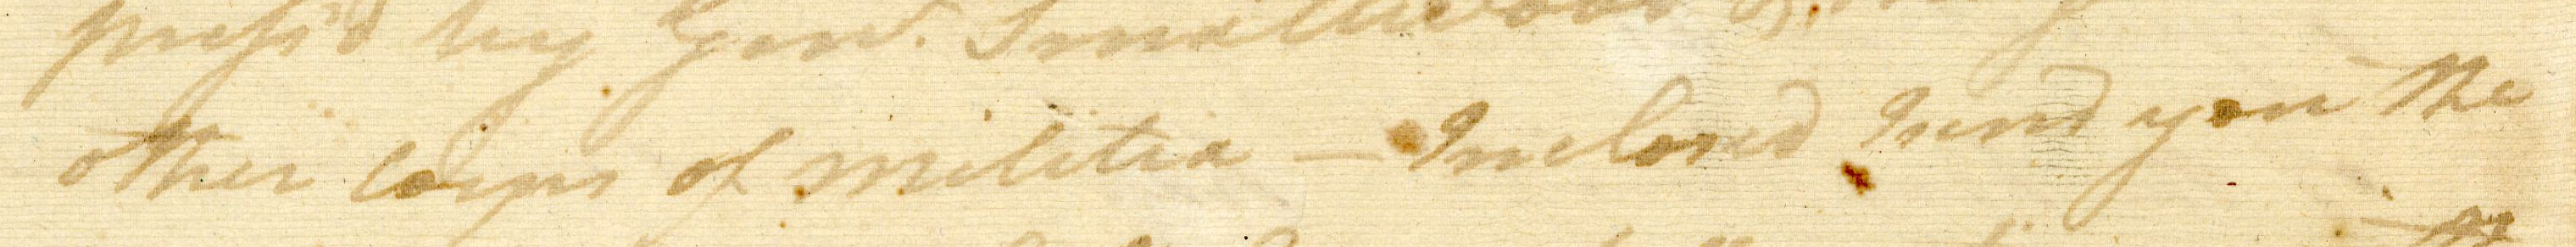other corps of militia- Inclosed I send you the
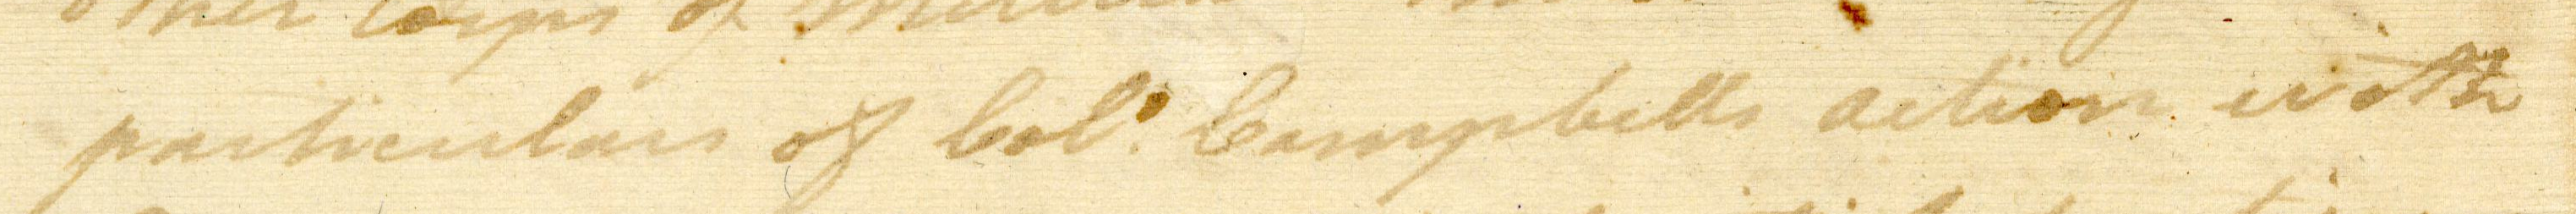particulars of Col^o. Campbells action with
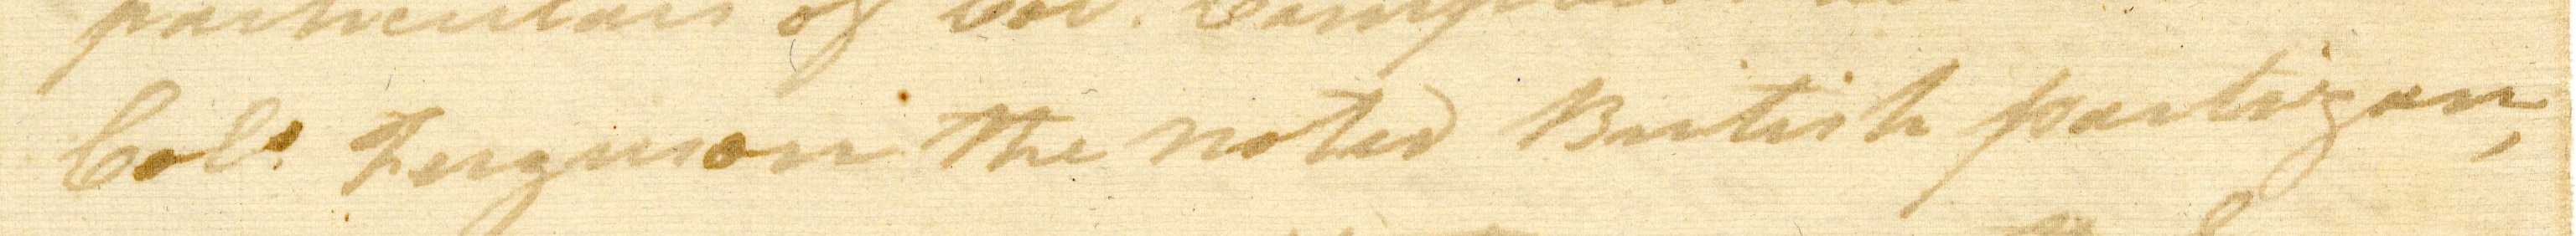Col^o. Ferguson the noted British partizan,
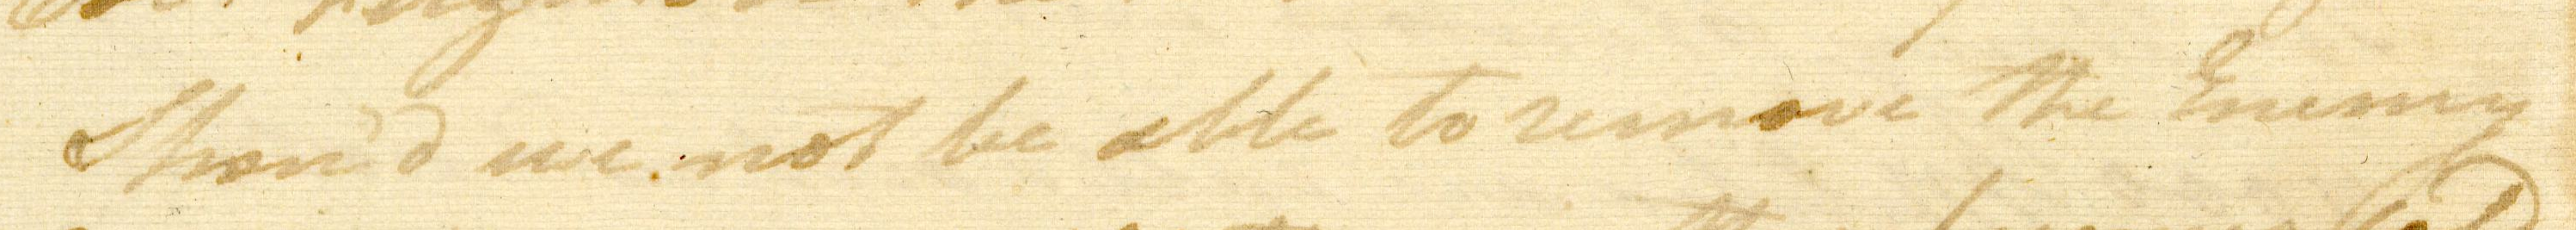Shou'd we not be able to remove the Enemy
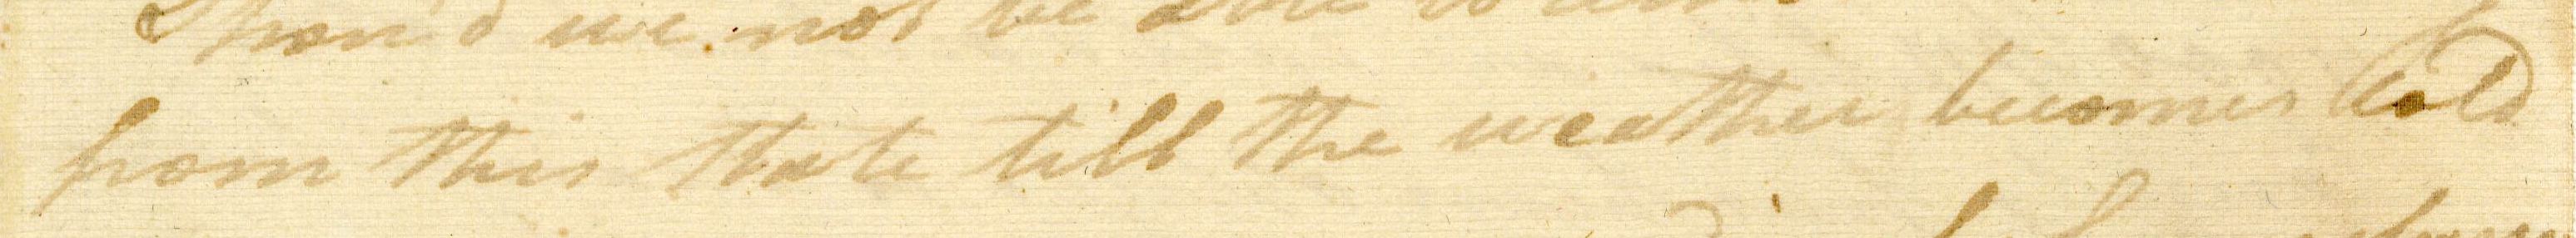from this state till the weather becomes cold
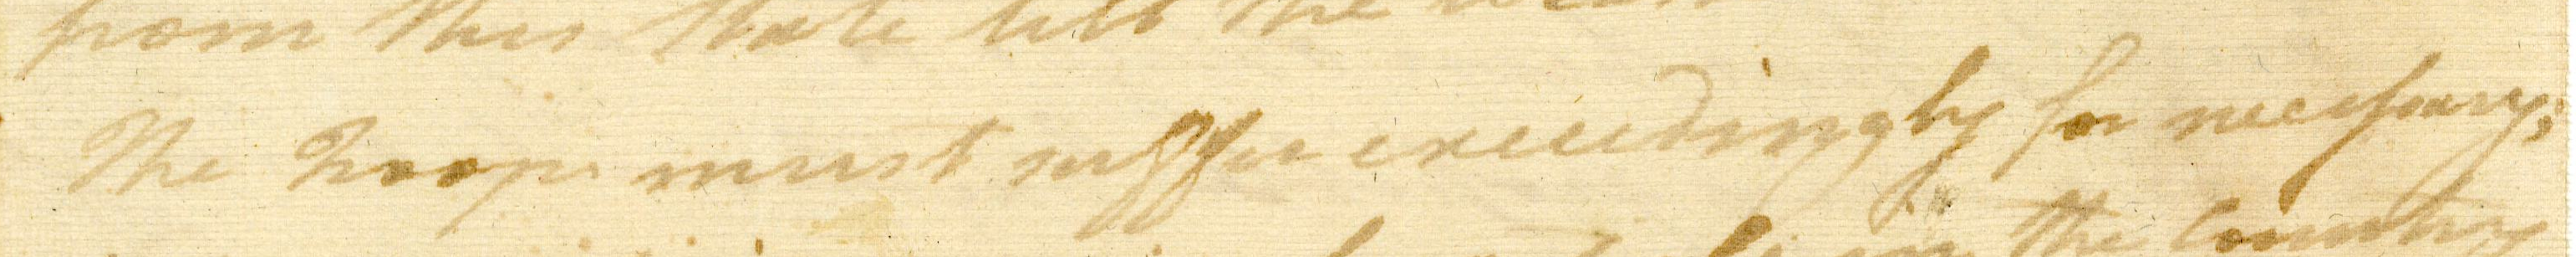The Troops must suffer exceedingly for necessary;
